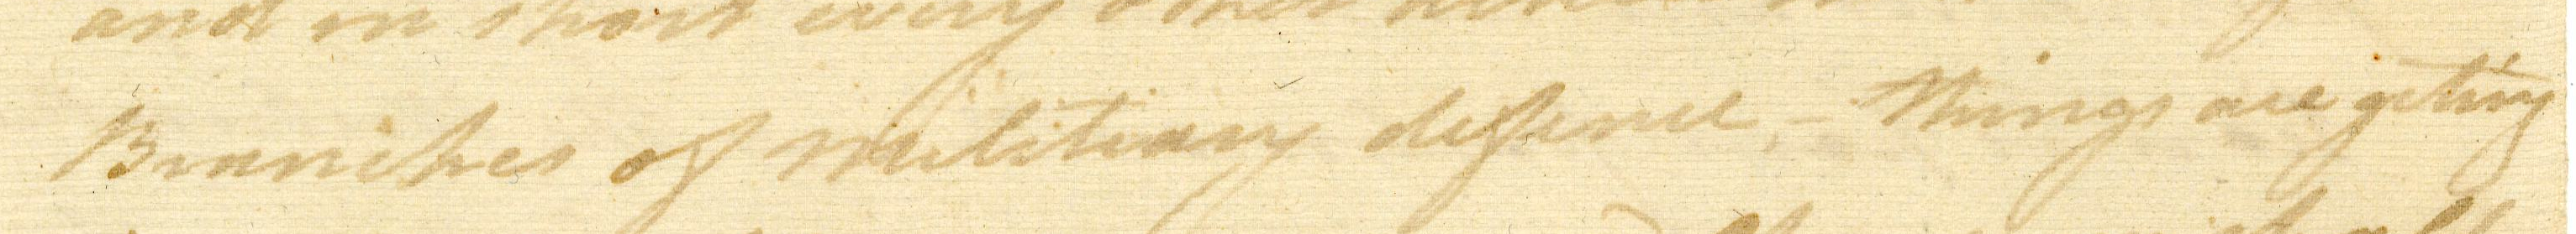Branches of Military defense,- things are getting
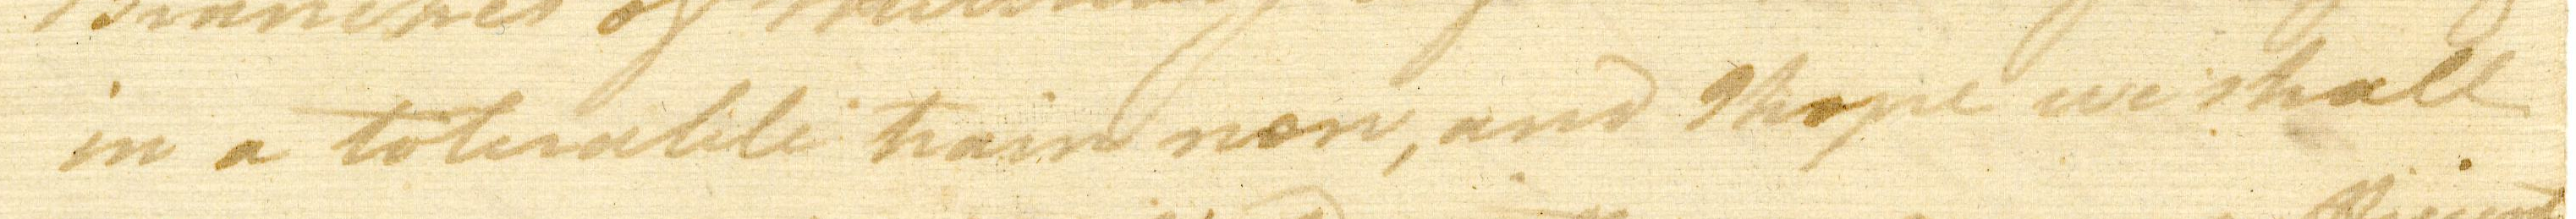in a tolerable train now, and I hope we shall
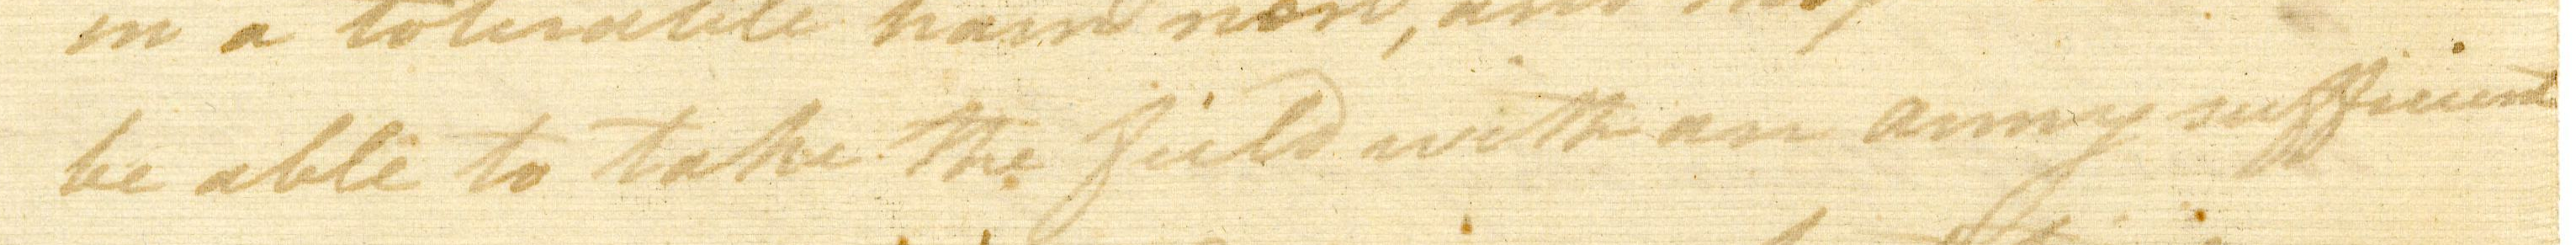be able to take the field with an army sufficient
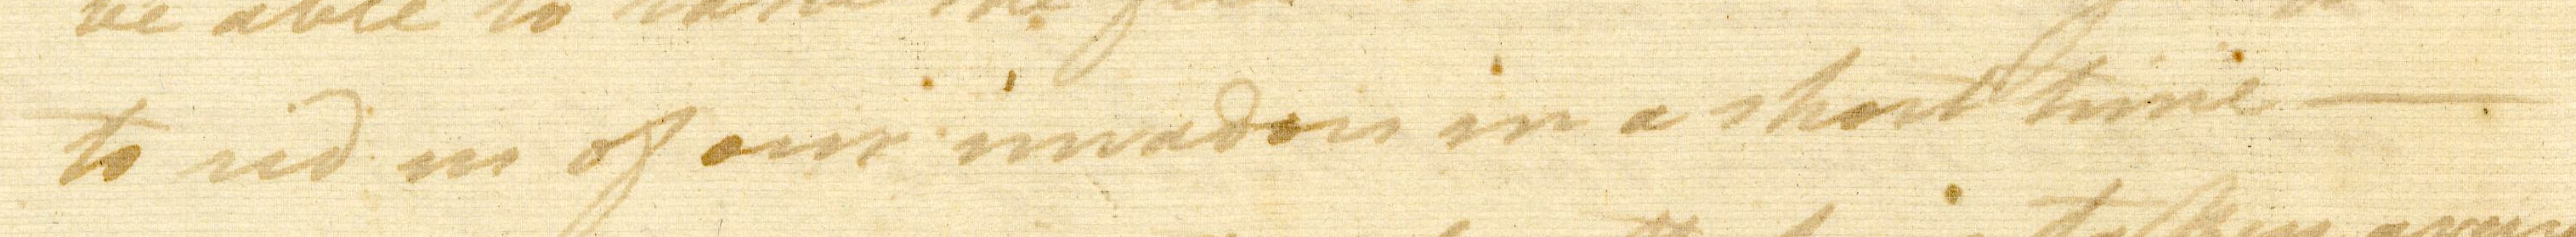to rid us of our invadors in a short time-
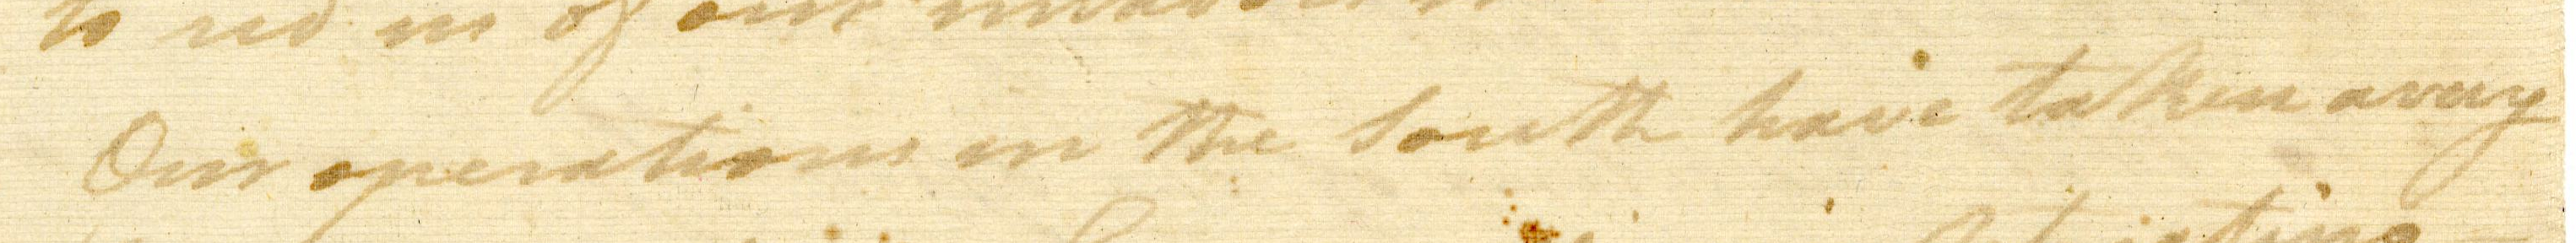Our operations in the South have taken a very
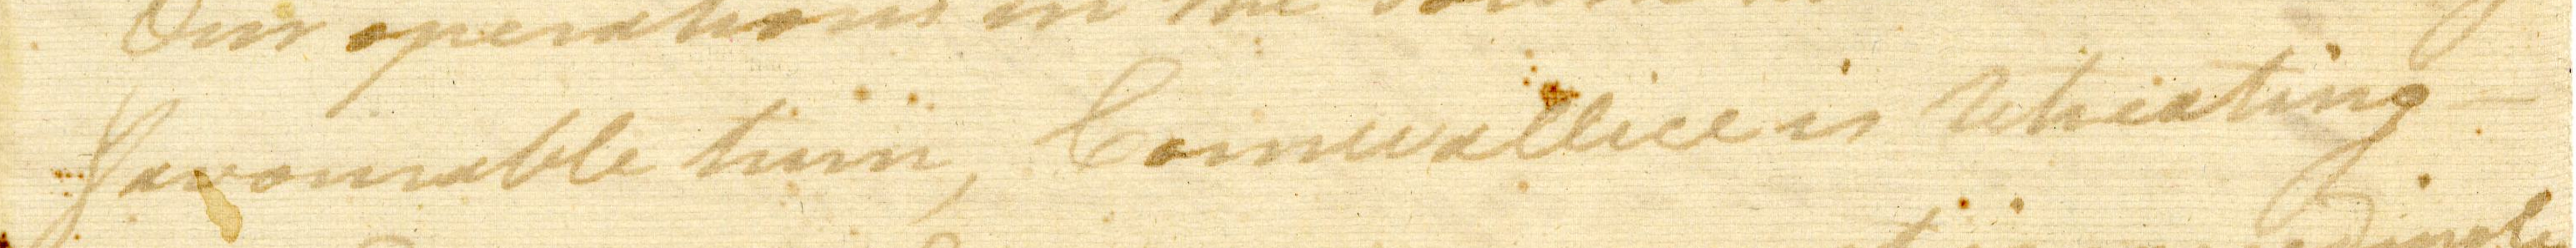favourable turn, Cornwallice is retreating
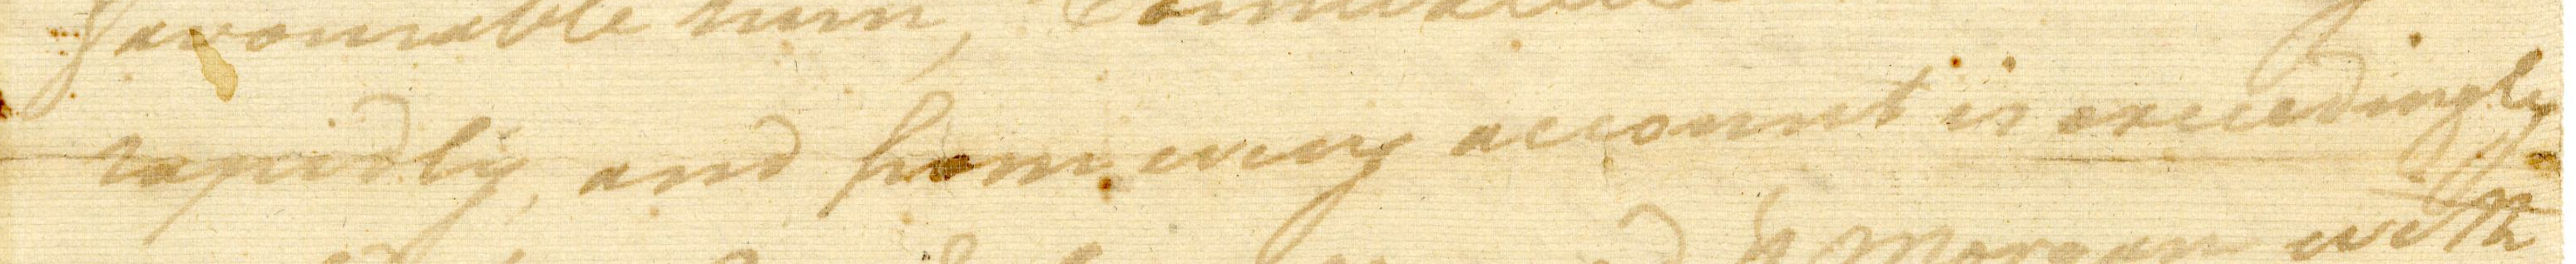rapidly and from every account is exceedingly
